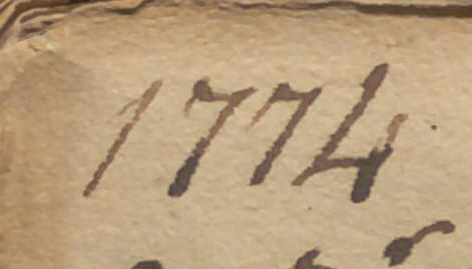1774
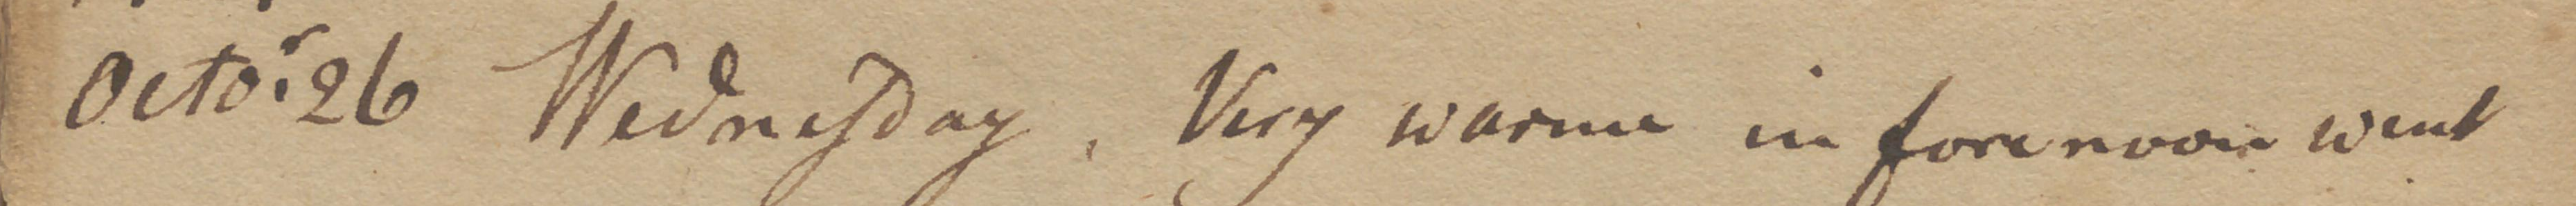Octo^r. 26 Wednesday, Very warme in forenoon went
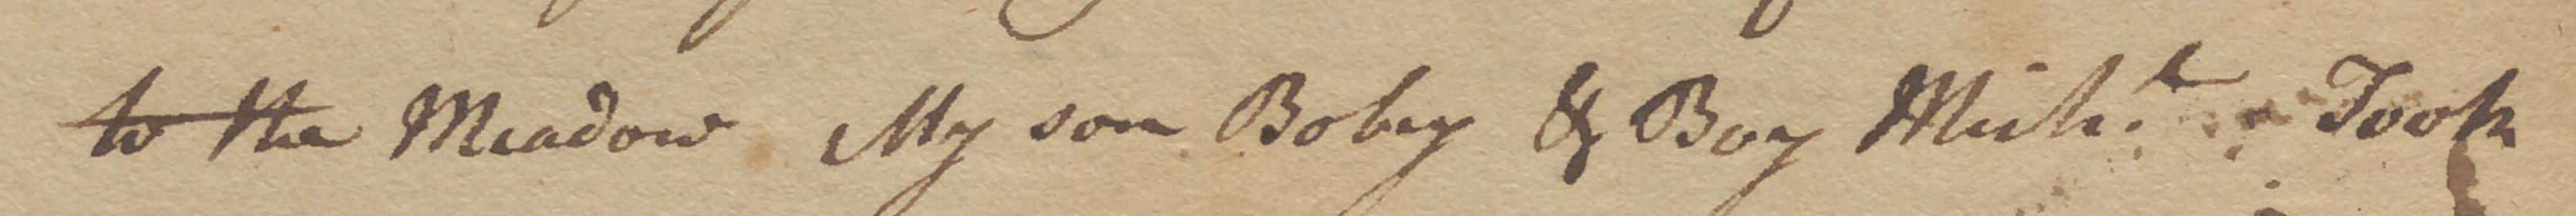to the Meadow My son Bobey & Boy Mich^l. Took
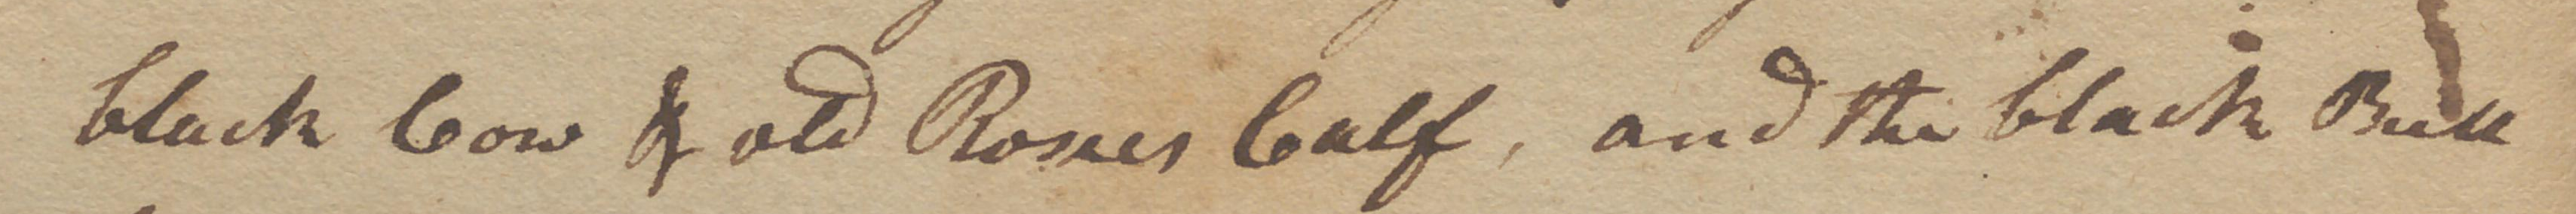black Cow & old Roses Calf, and the black Bull
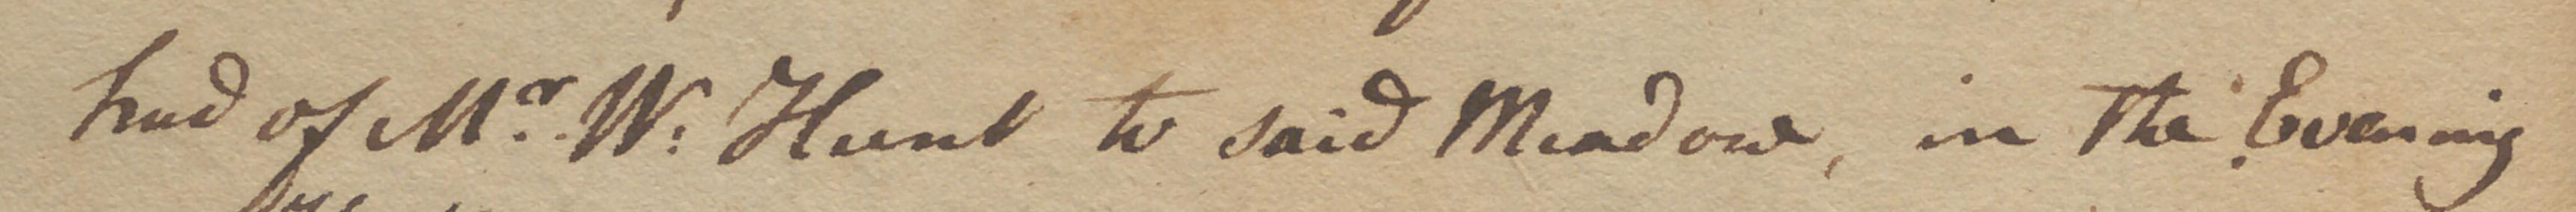had of M^r. W: Hunt to said Meadow, in the Evening
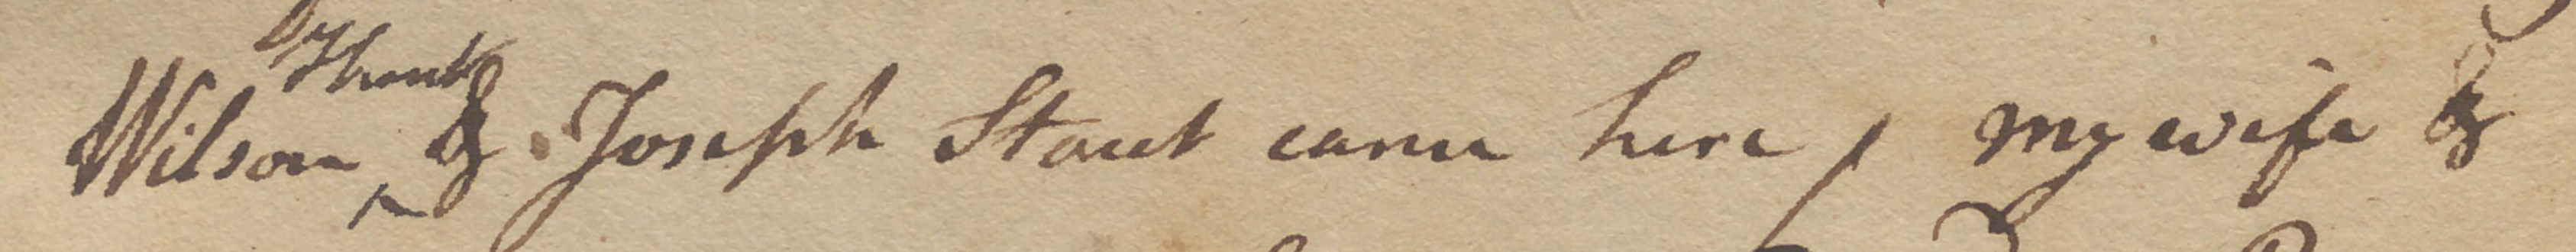Wilson ^ & Joseph Stout came here, my wife &
